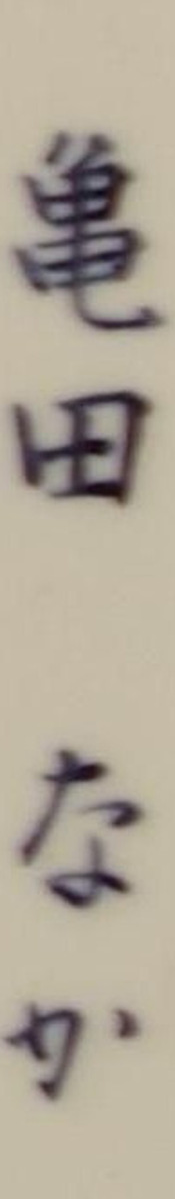亀田なか
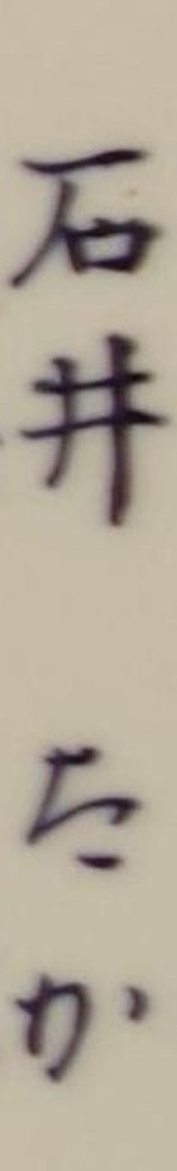石井たか
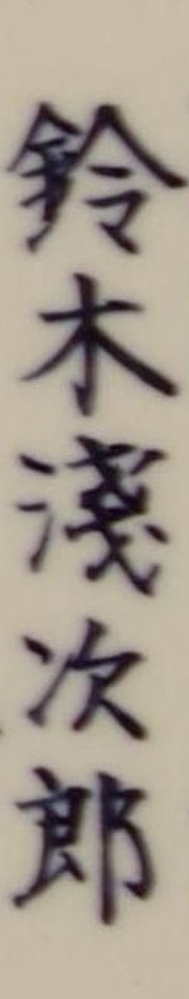鈴木浅次郎
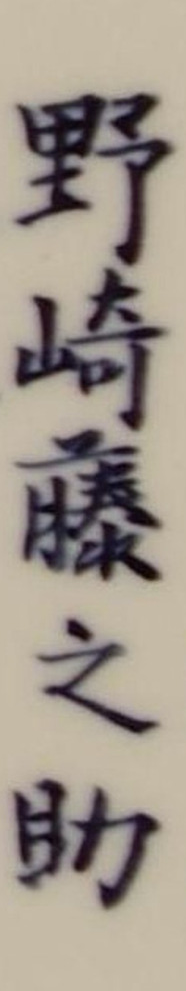野崎藤之助
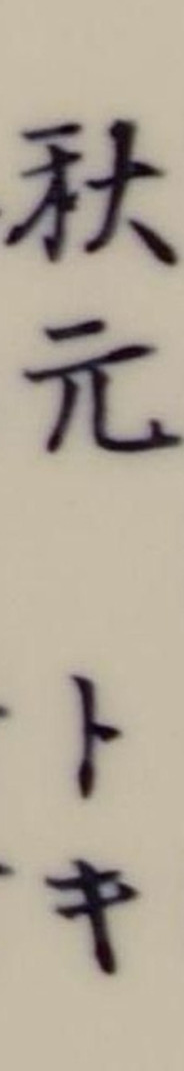秋元トキ
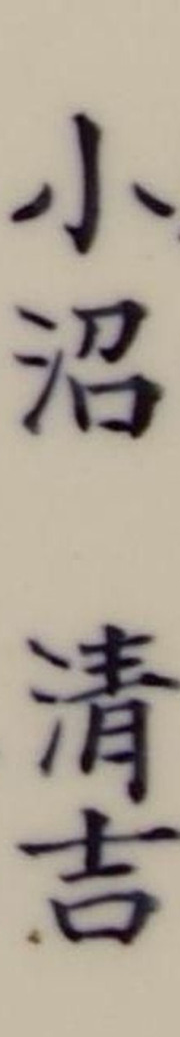小沼清吉
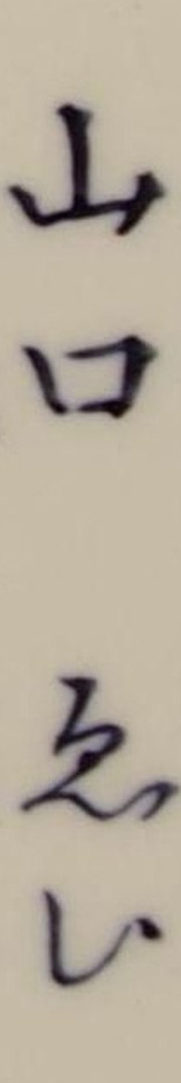山口ゑい
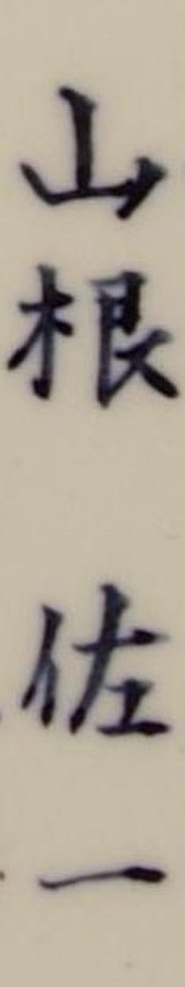山根佐一
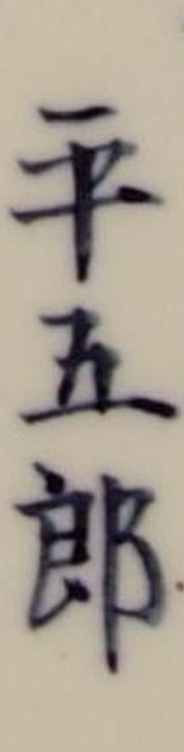平五郎
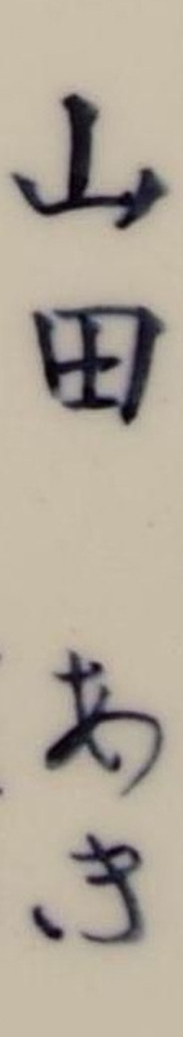山田あき
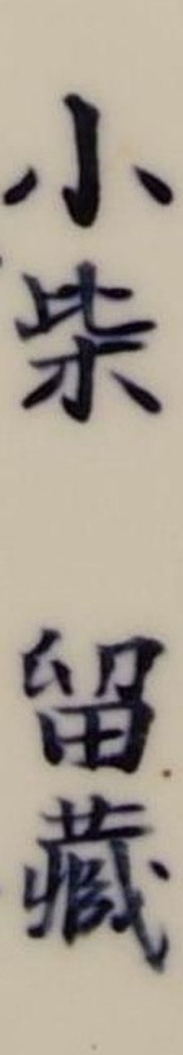小柴留蔵
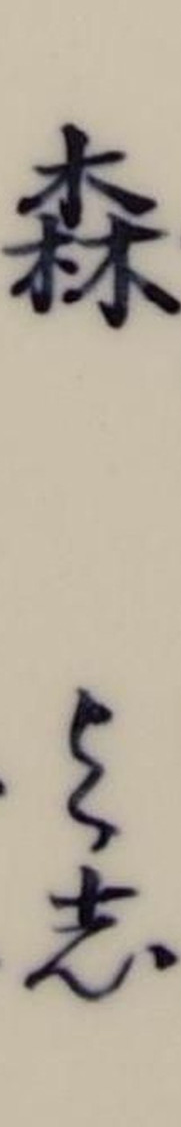森よし
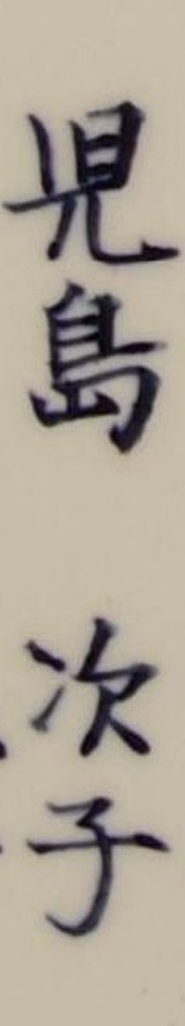児島次子
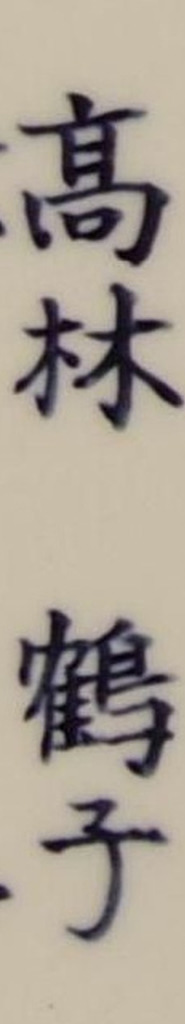高林鶴子
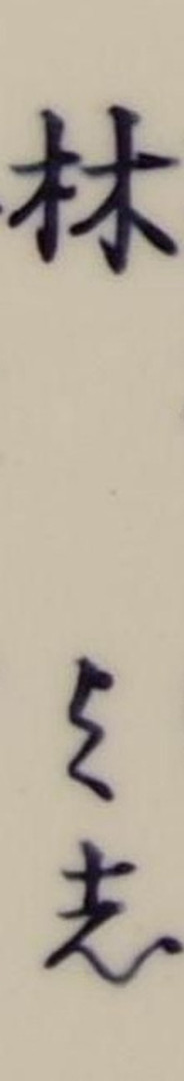森よし
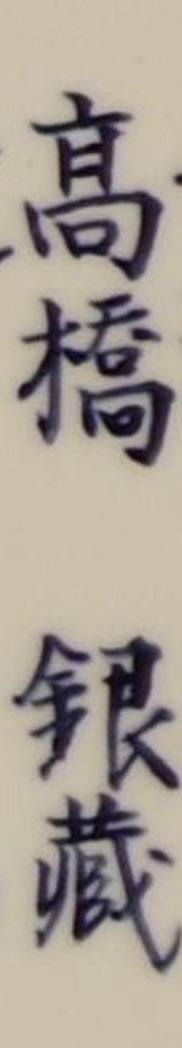高橋銀蔵
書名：M~S
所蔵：高野山金剛峯寺
